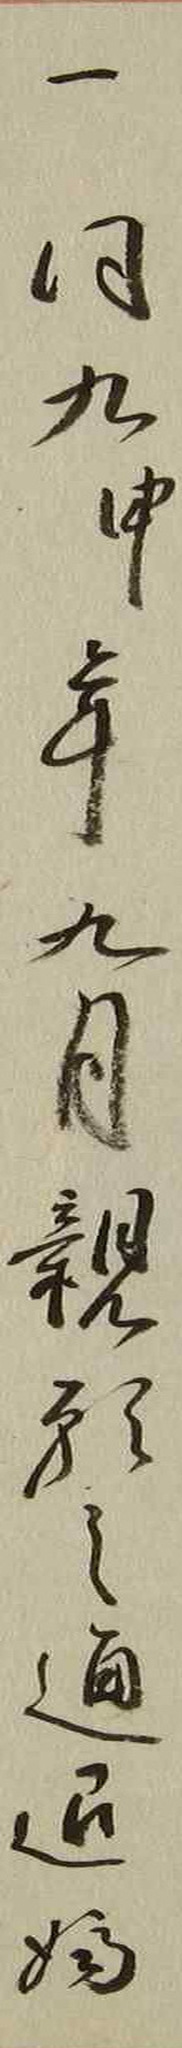一同九申年九月親願之通退嫡
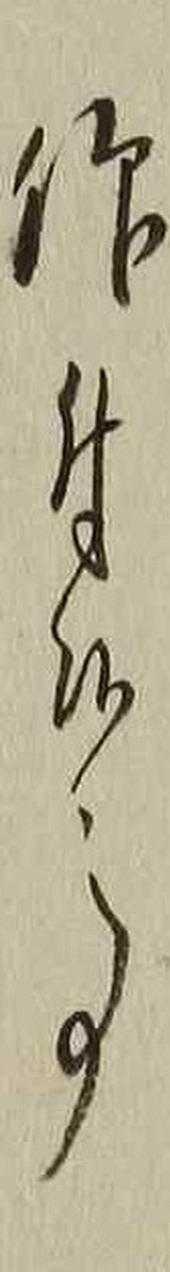仰付候事
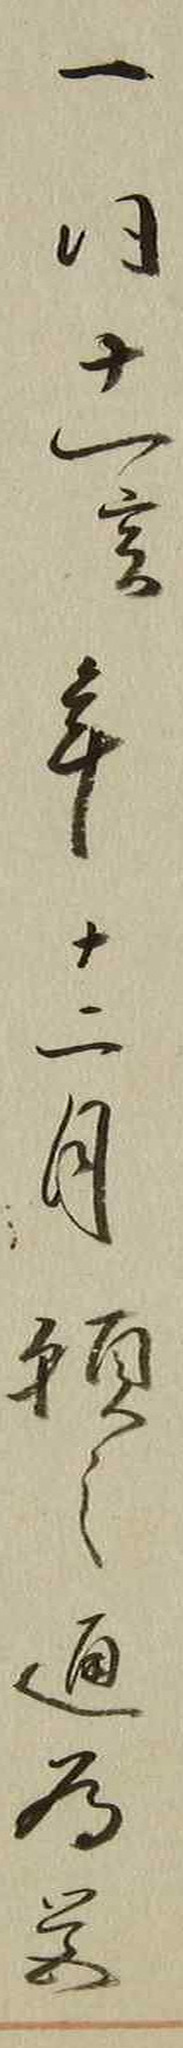一同十一亥年十二月願之通為営
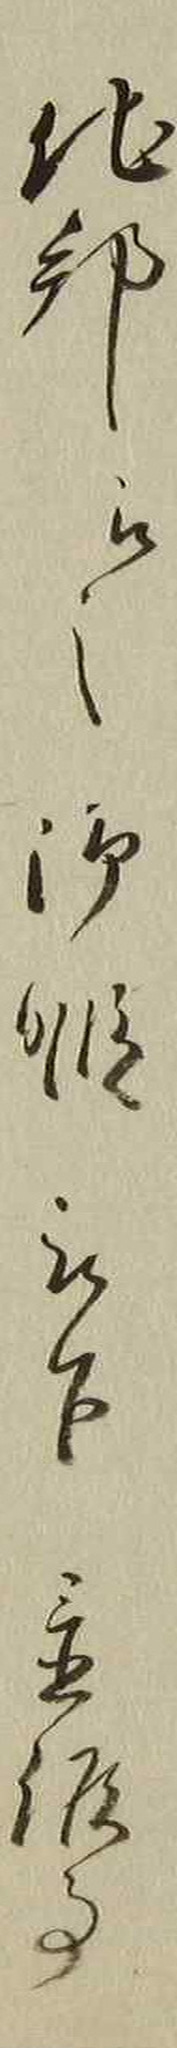他邦江之御暇被下置候事
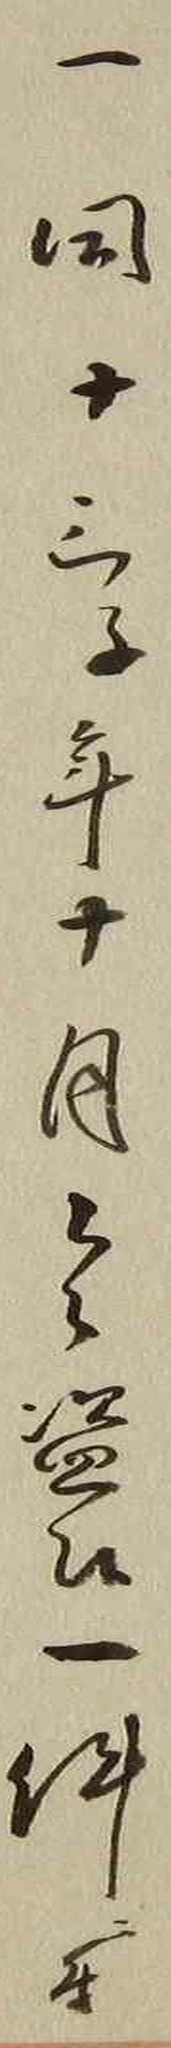一同十三子年十月くら盗候一件ニ付
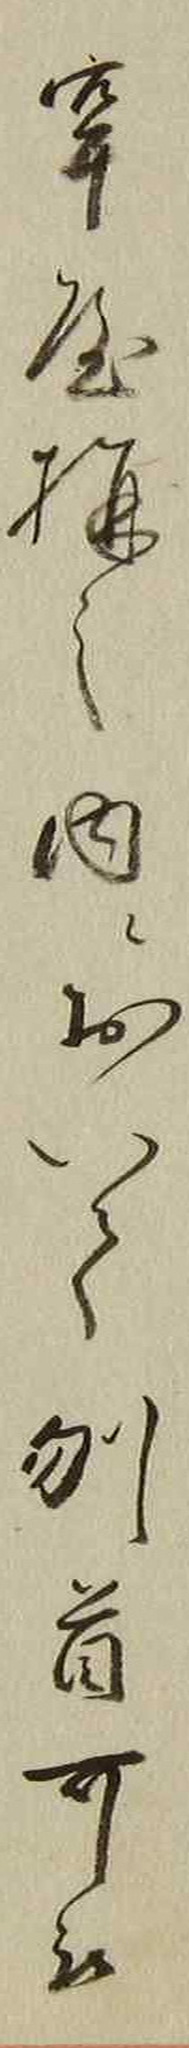牢屋構之内ニおいて刎首可被
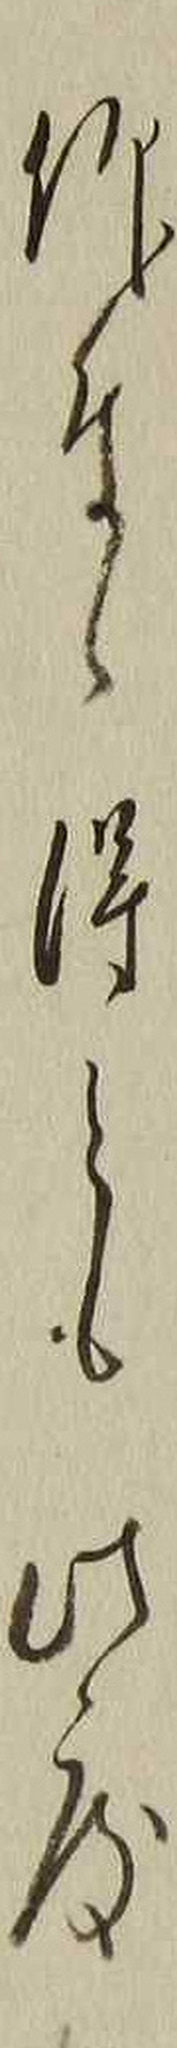仰付候得とも此度
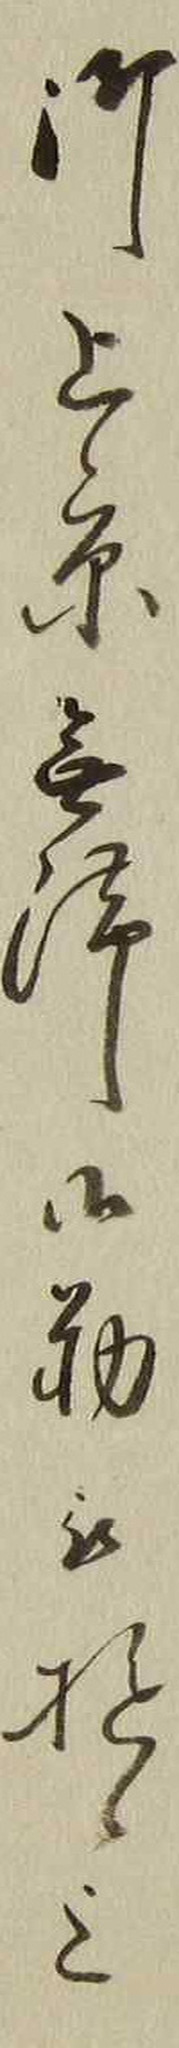御上京無滞相勤被遊候上
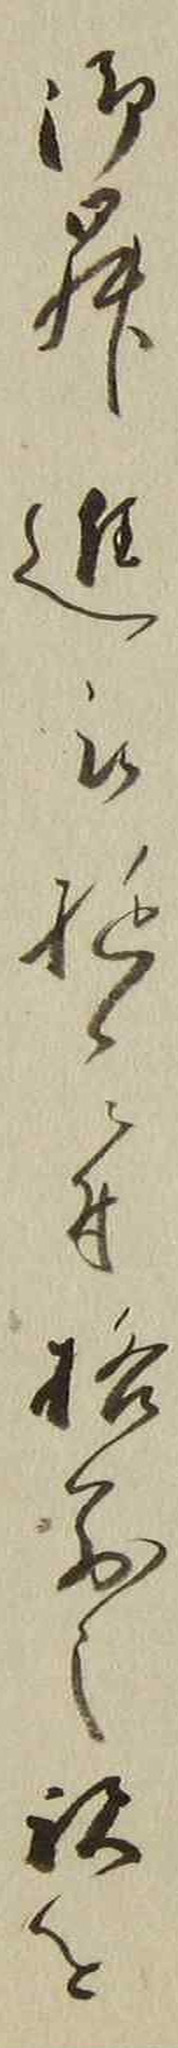御昇進被遊候ニ付格別之訳を
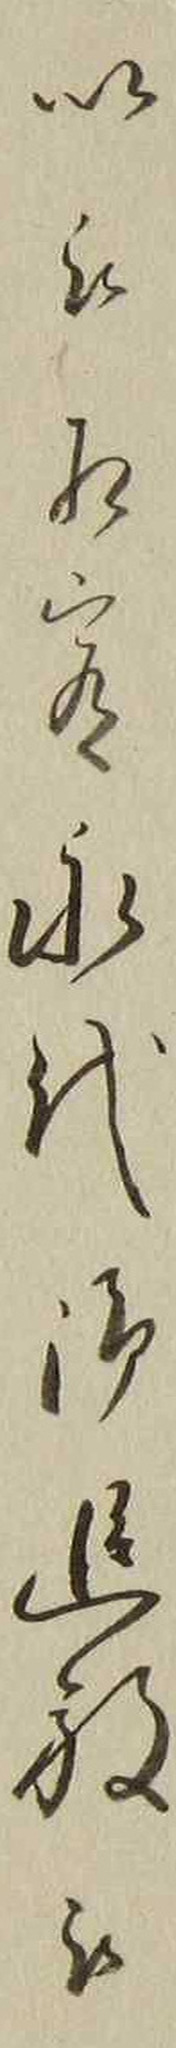以被相宥永代御追放被
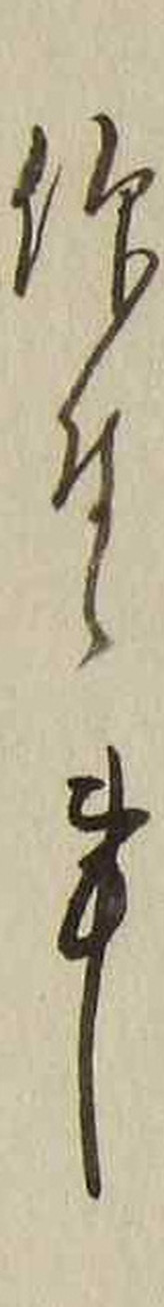仰付候事
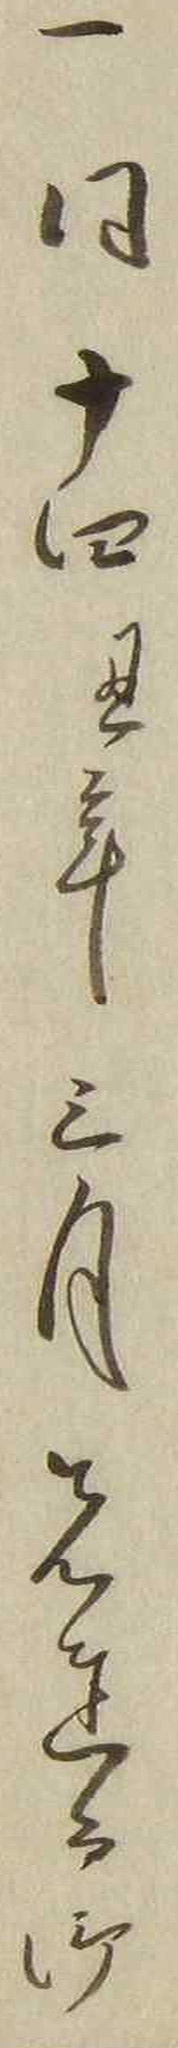一同十四丑年三月先達被御

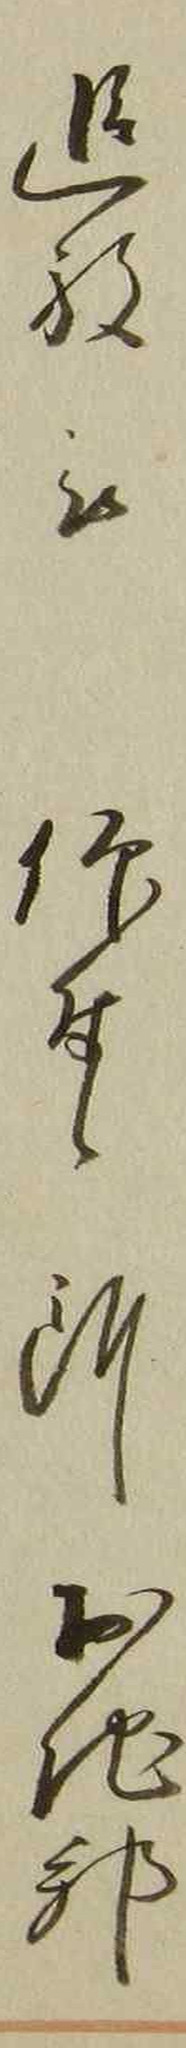追放被仰付候所於他邦
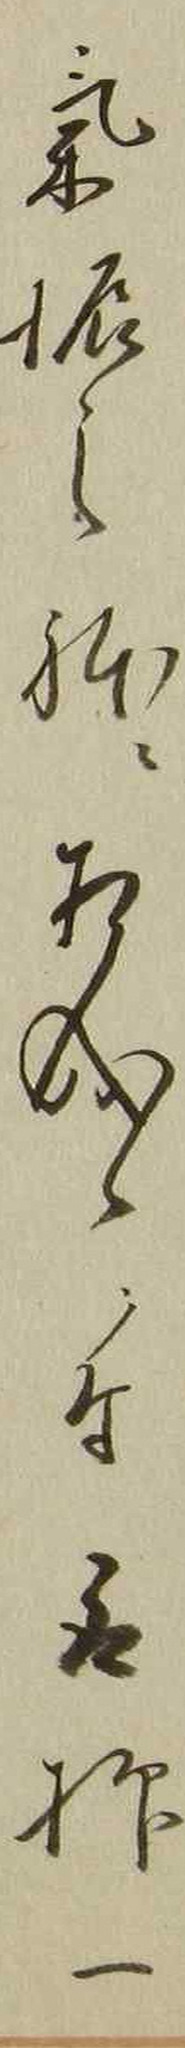気振之体ニ相成候ニ付取抑一
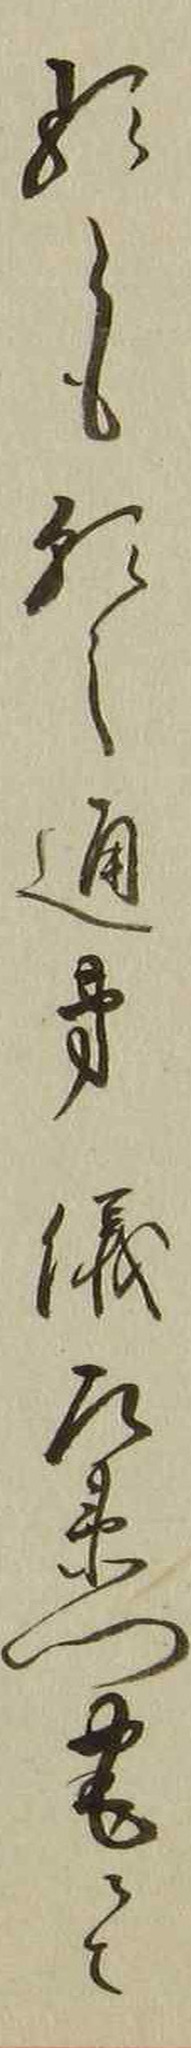類とも願之通弟儀左衛門宅ニて
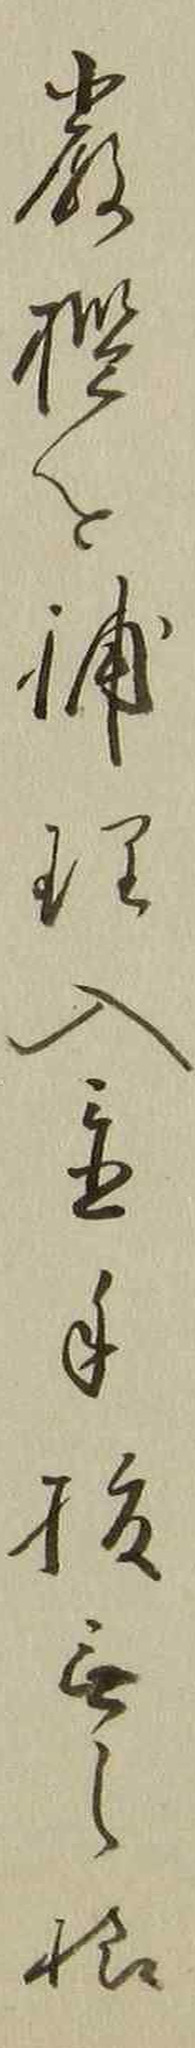厳檻を補理入置手抜無之様
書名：諸士系譜　巻之122　よ之部5
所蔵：会津若松市立会津図書館
